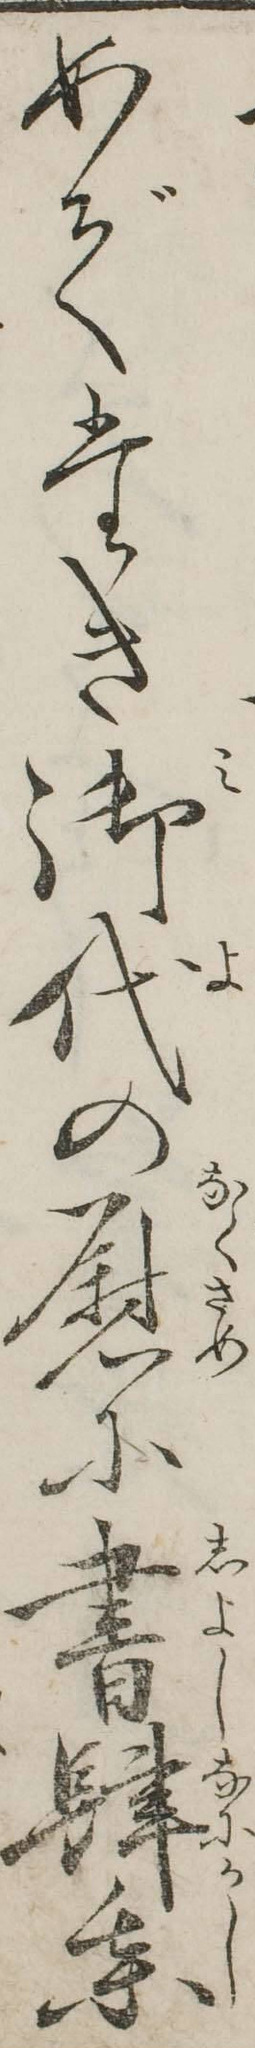めでたき御代の慰に書肆某
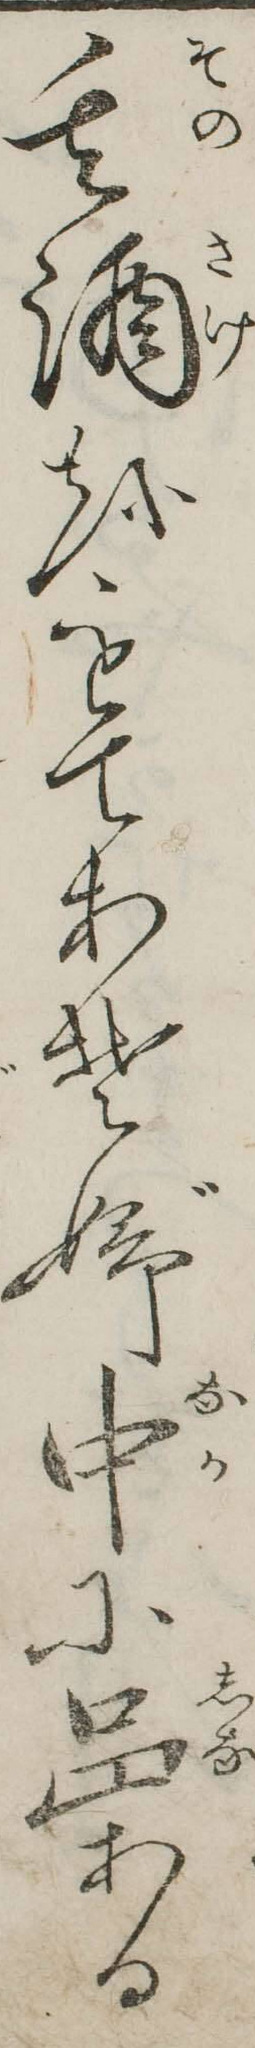其酒をもてあそぶ中に品ある
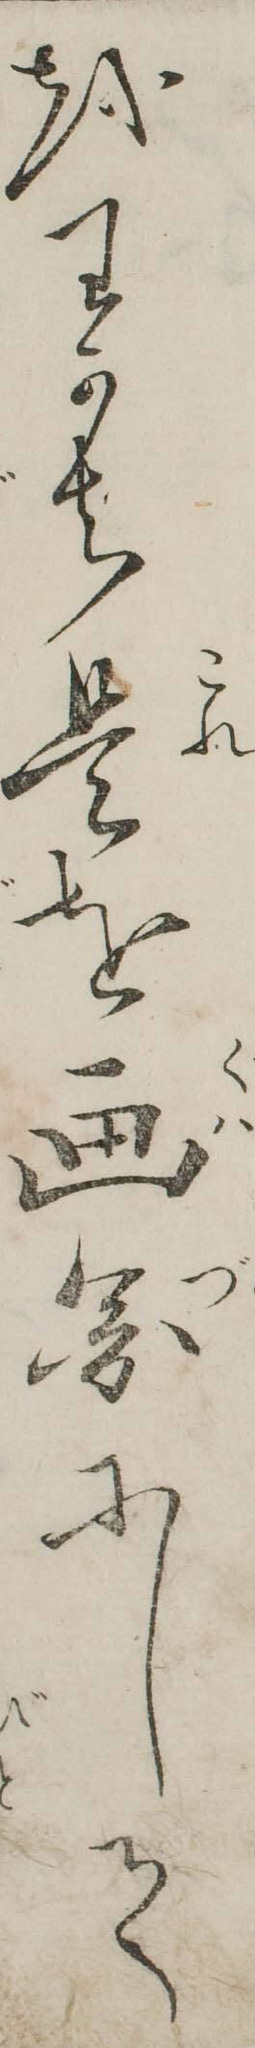をわかち是を画図にして
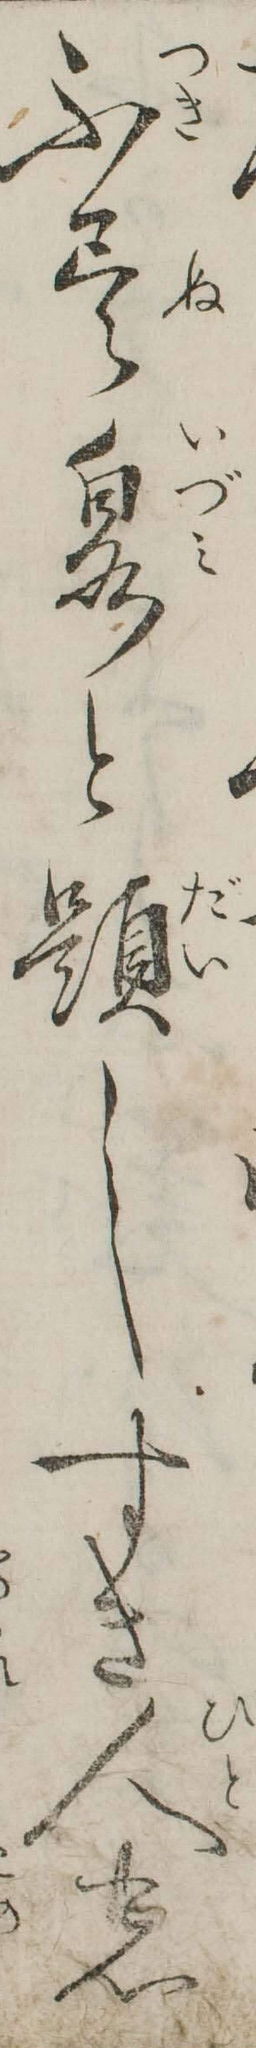不尽泉と題しすき人の
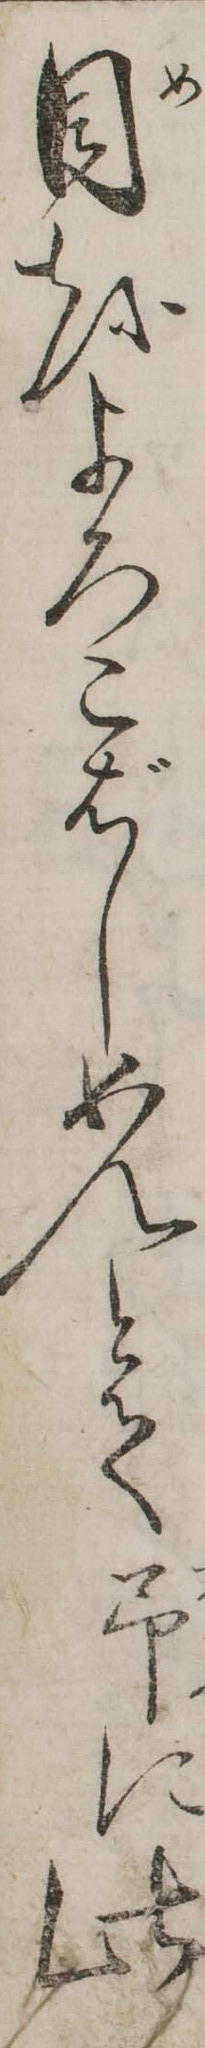目をよろこばしめんとて予に此

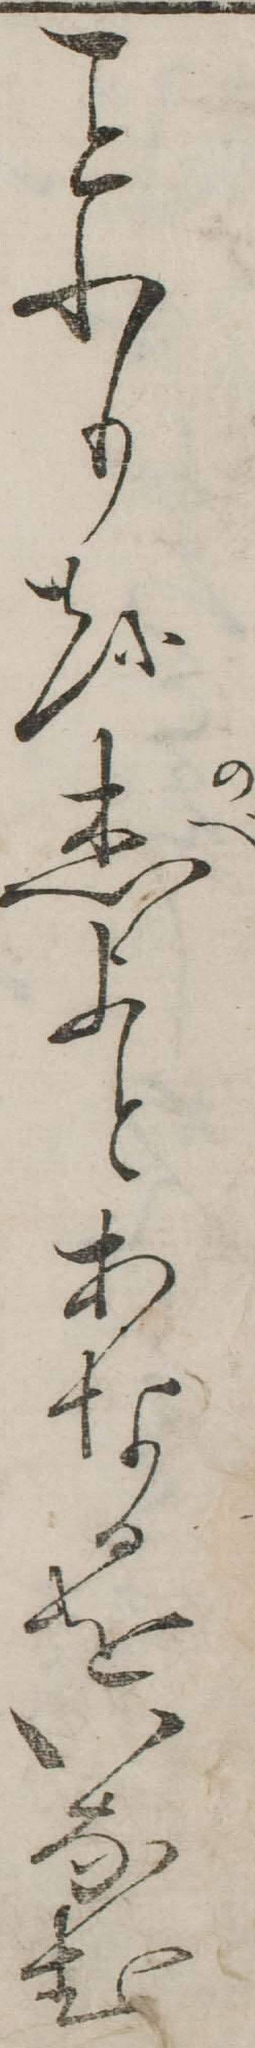ことわりを述よとあなるをいなむ
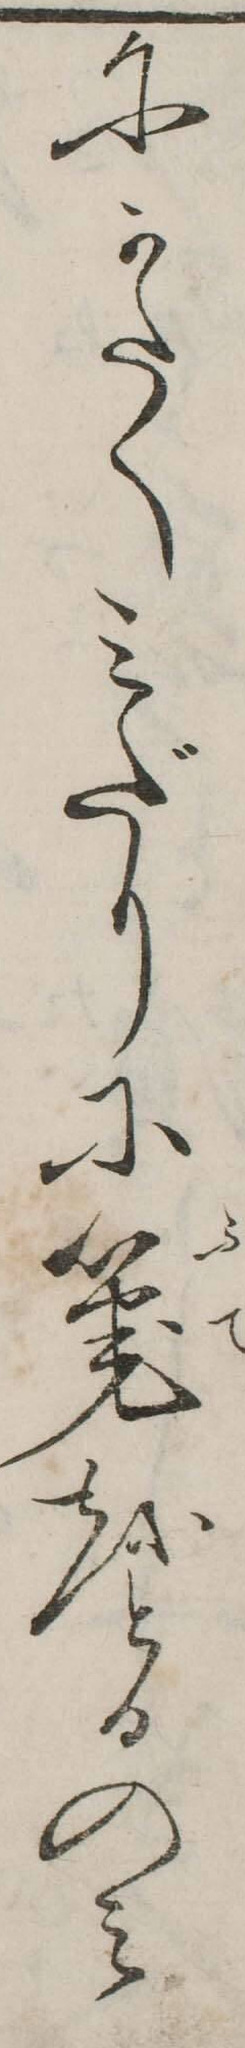にかたくみだりに筆をとるのみ
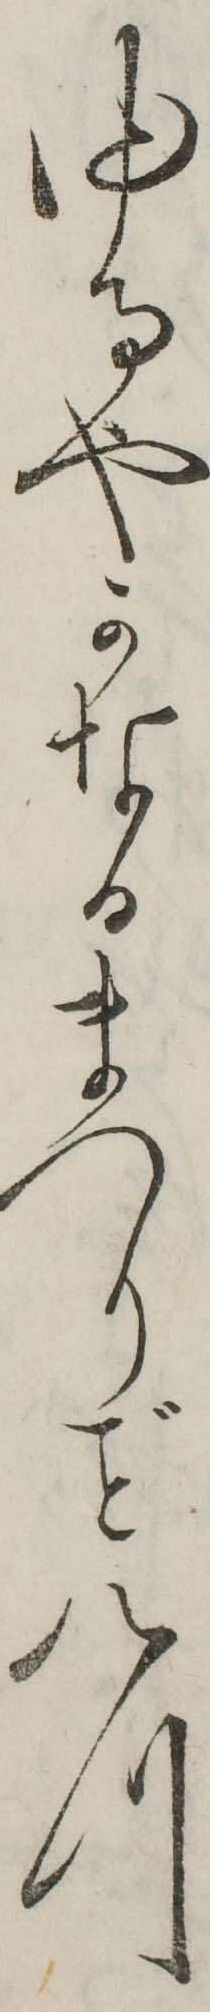ゆるやかなるまつりごと八つ
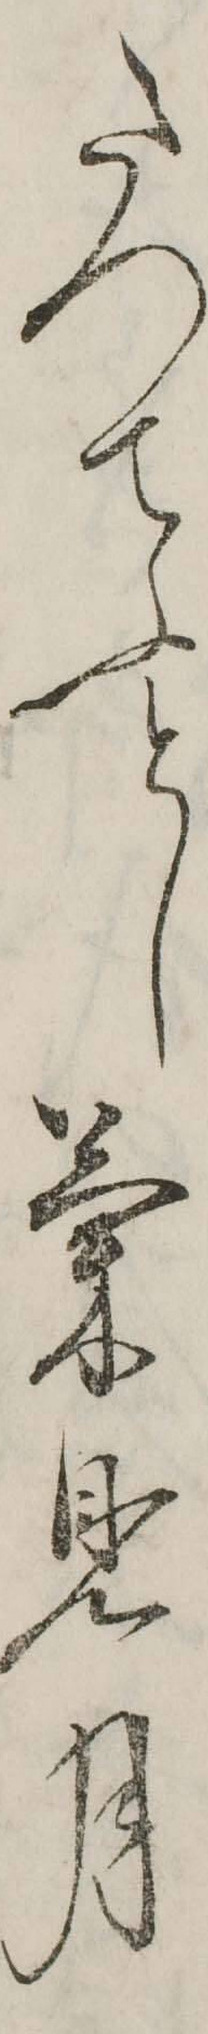たつてふとし菊見月
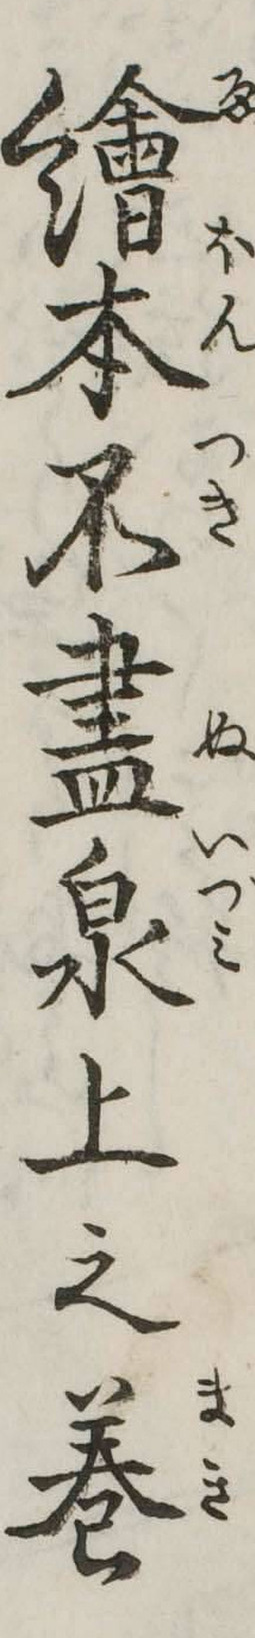絵本不尽泉上之巻

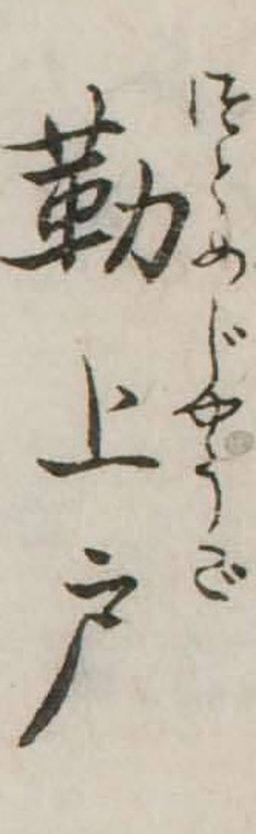勤上戸
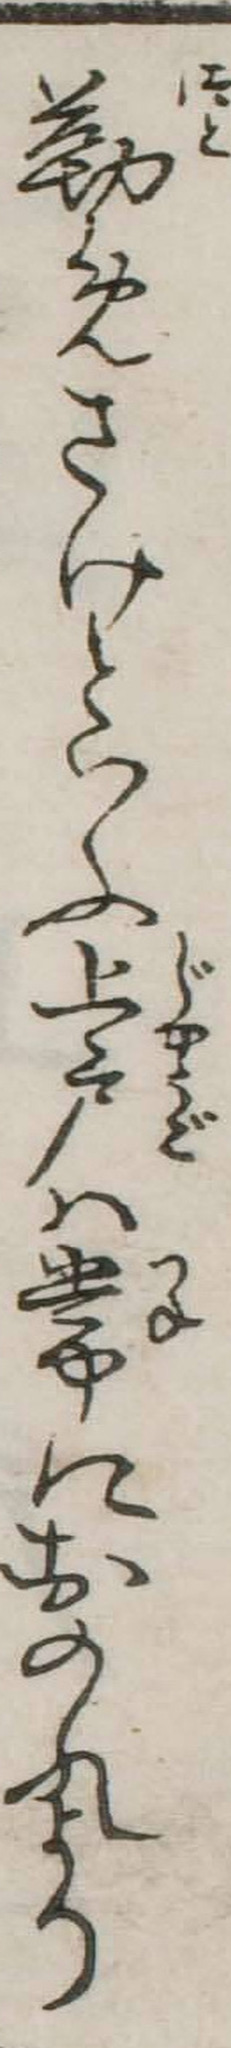勤めさけといふ上戸は常におのれより
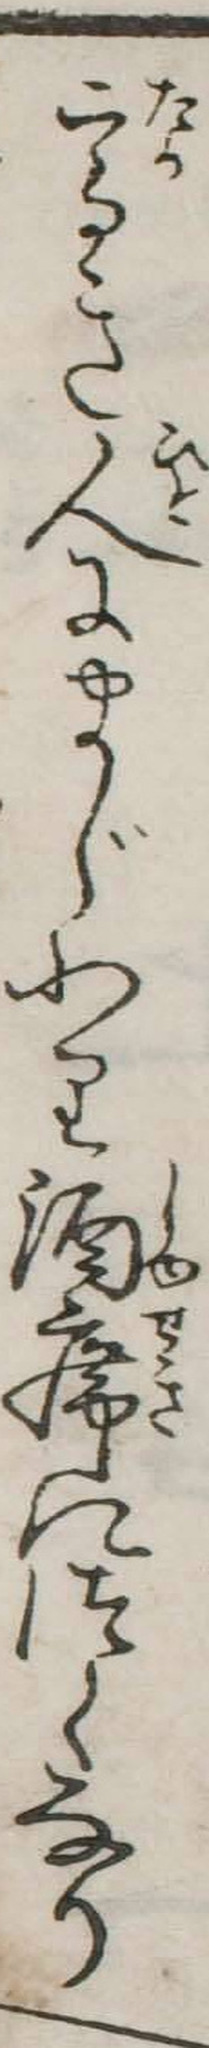高き人にまじわり酒席につくなり
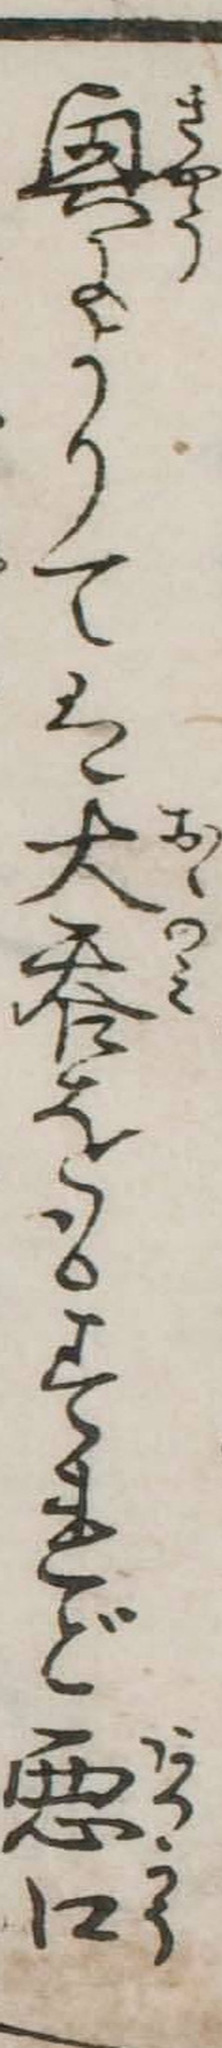興によりては大呑をもすれど悪口
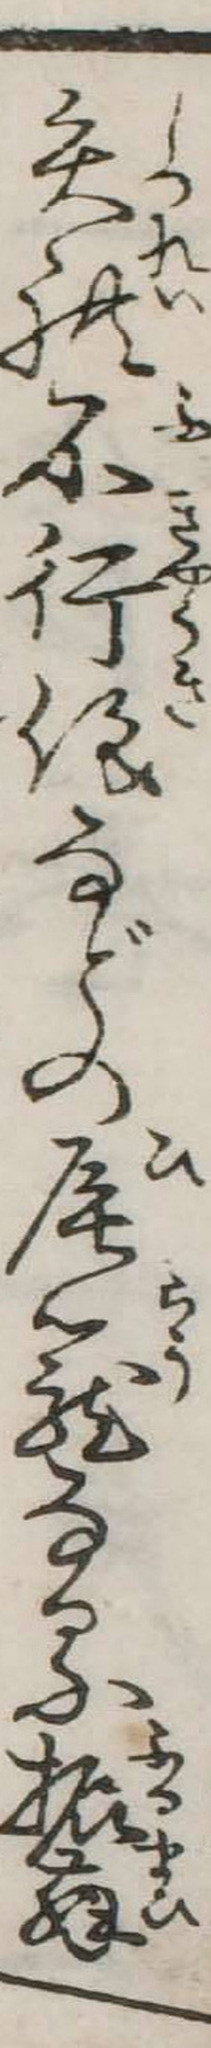失礼不行儀などの尾籠なる振舞
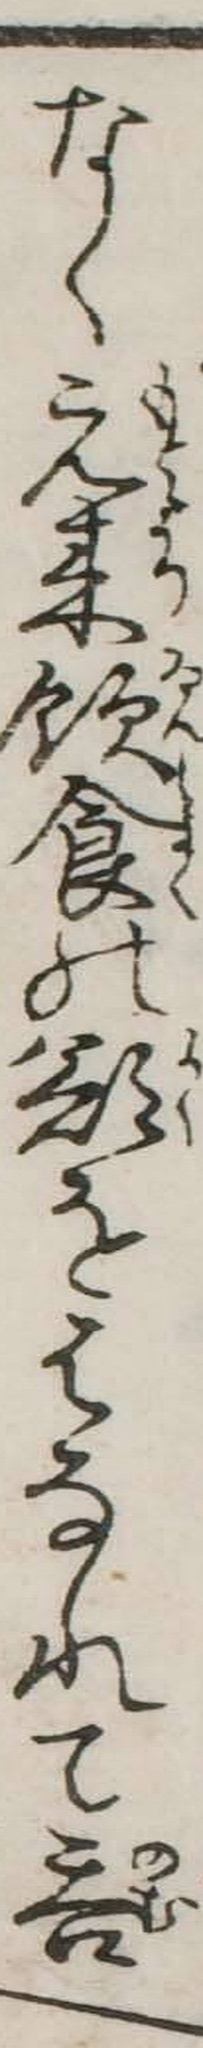なく元来飲食の欲をはなれて呑
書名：繪本不盡泉
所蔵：国文学研究資料館
